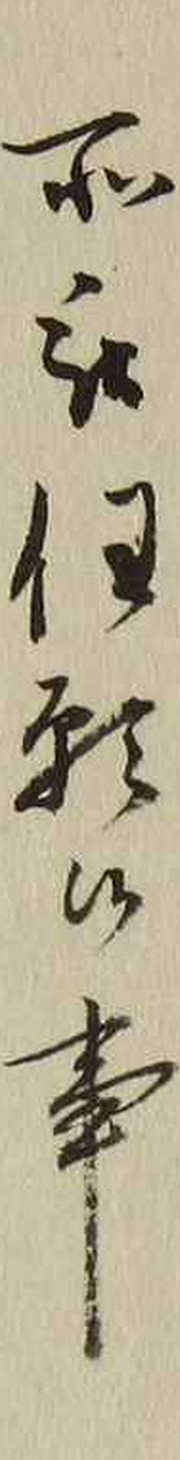所被任願候事
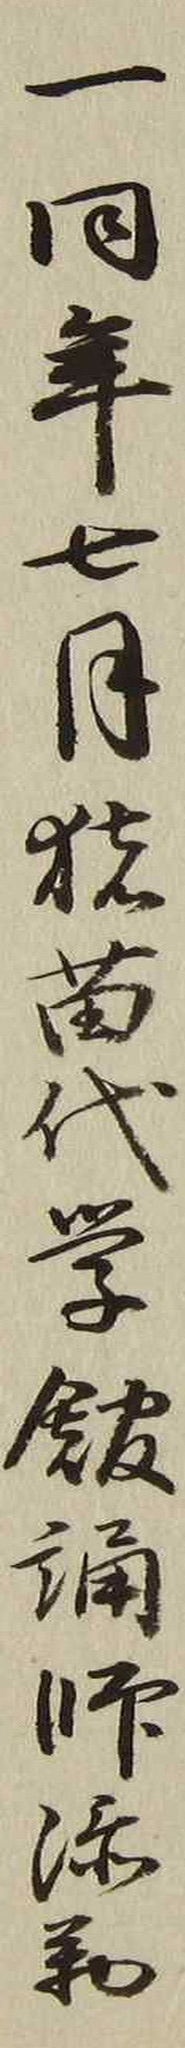一同年七月猪苗代学館誦師添勤
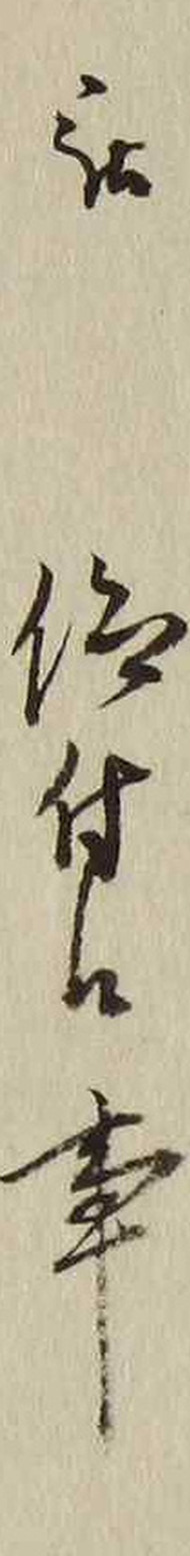被仰付候事
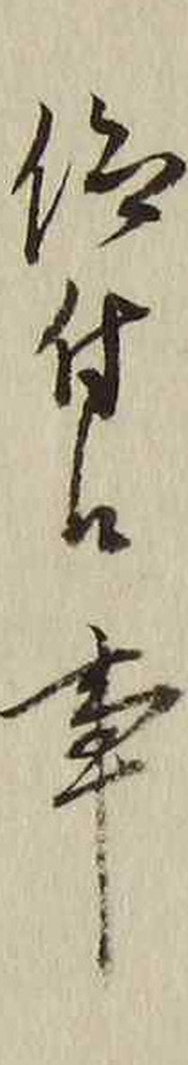仰付候事
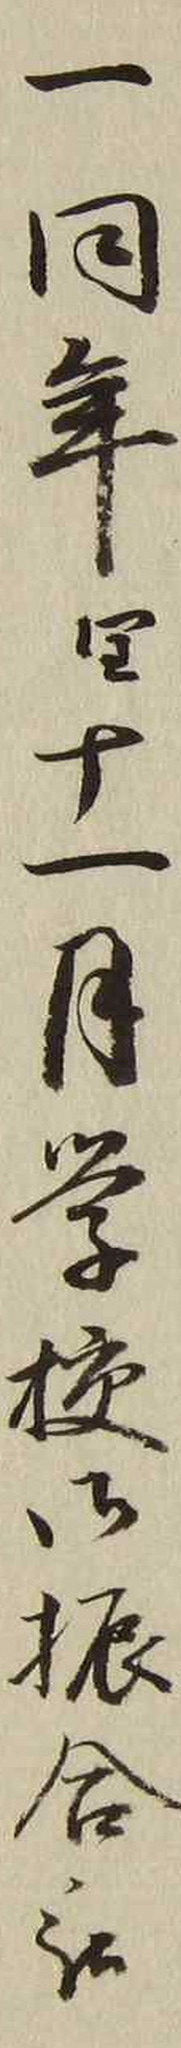一同年閏十一月学校御振合被
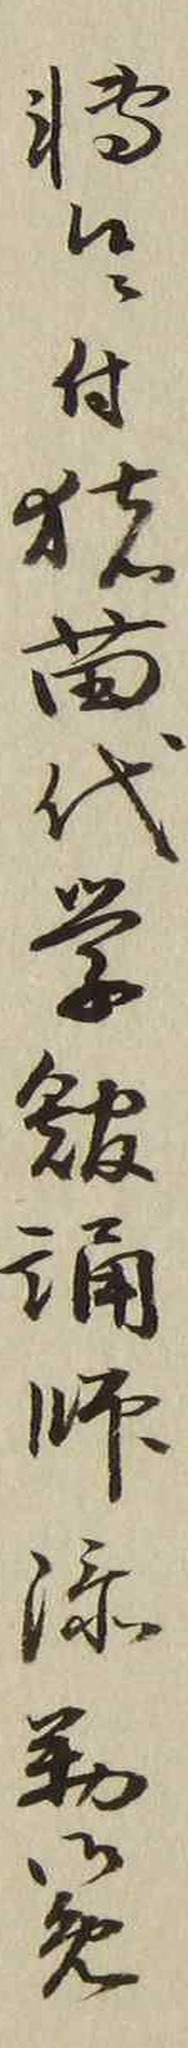転候ニ付猪苗代学館誦師添勤御免

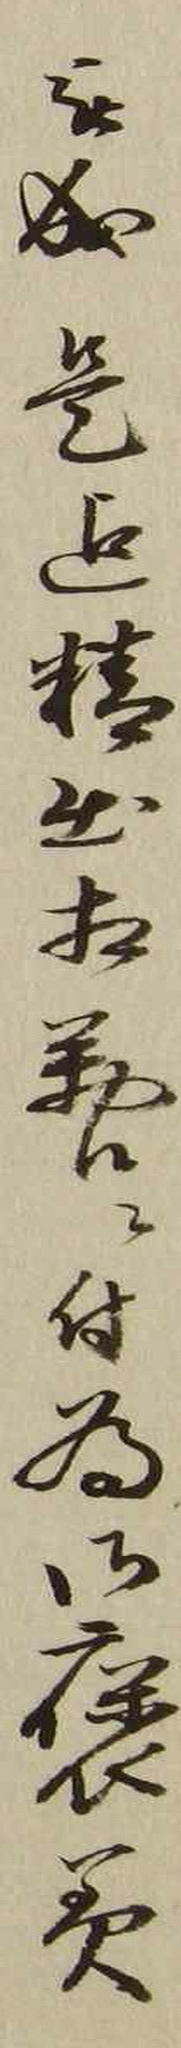被成是迄精出相勤候ニ付為御褒美
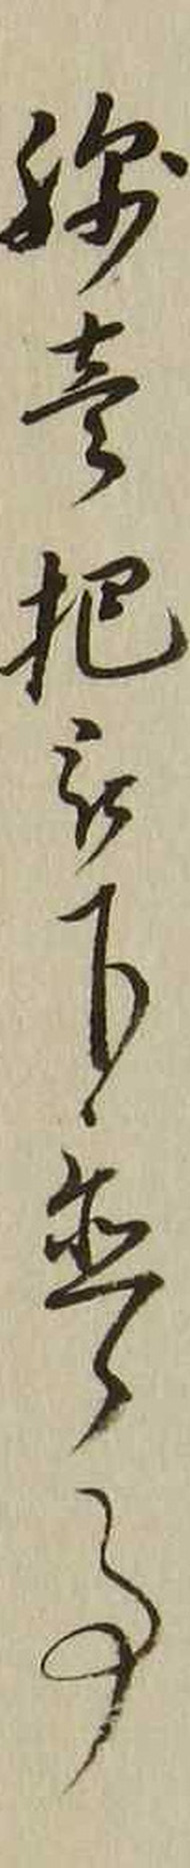綿壱把被下置候事
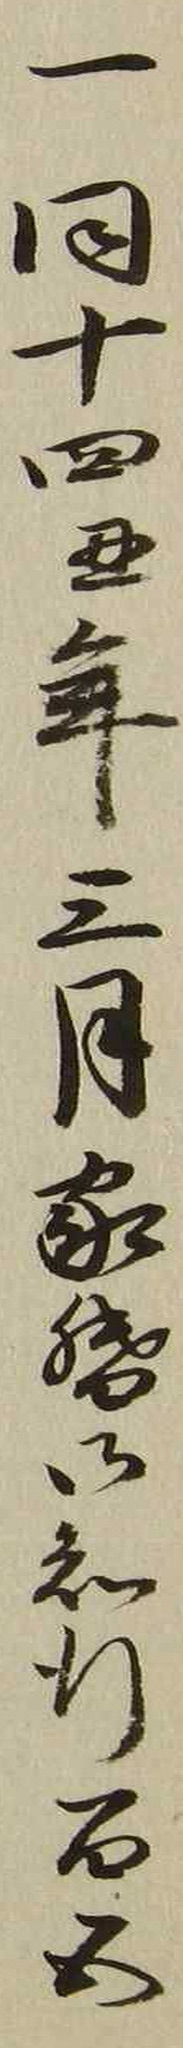一同十四丑年三月家督御知行百五
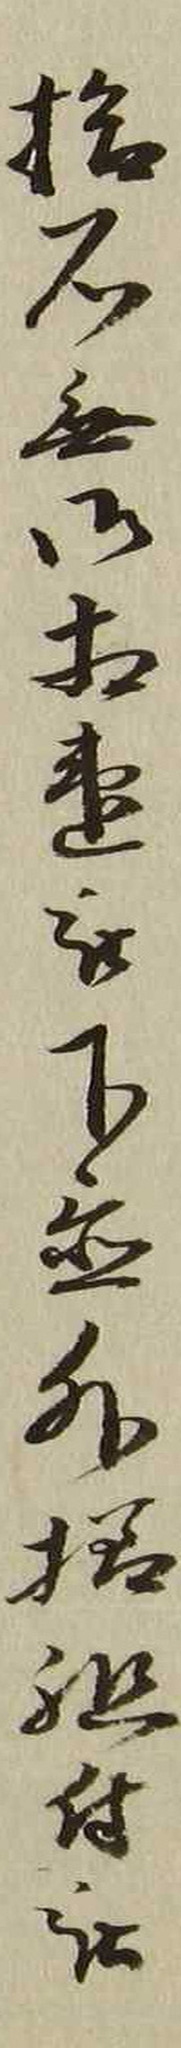拾石無御相違被下置外様組付被
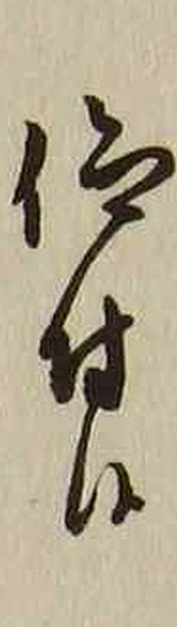仰付候
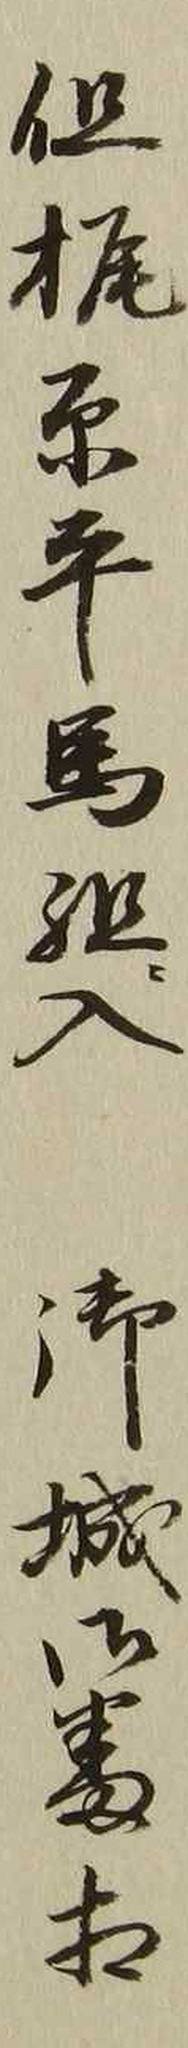但梶原平馬組ニ入御城御番相
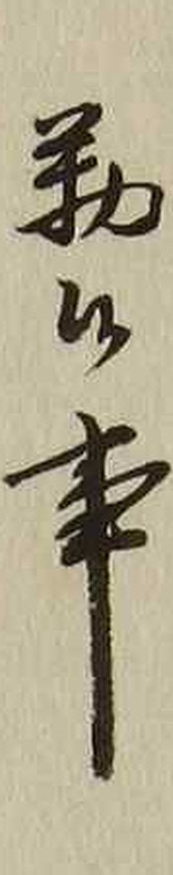勤候事
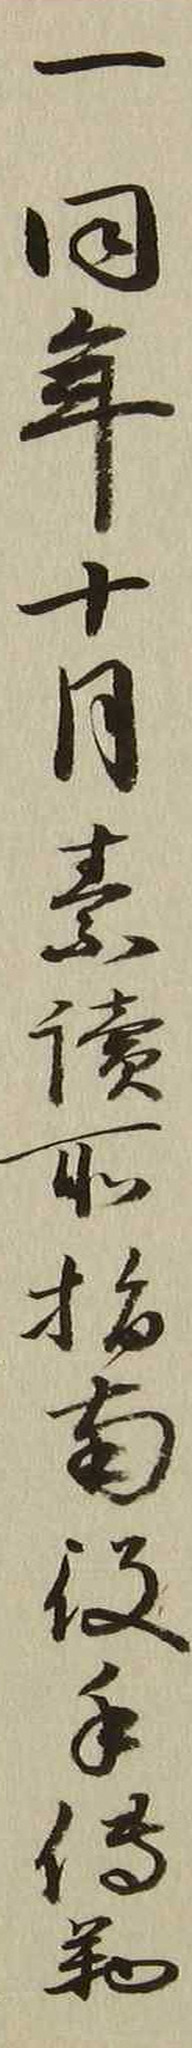一同年十月素読所指南役手伝勤
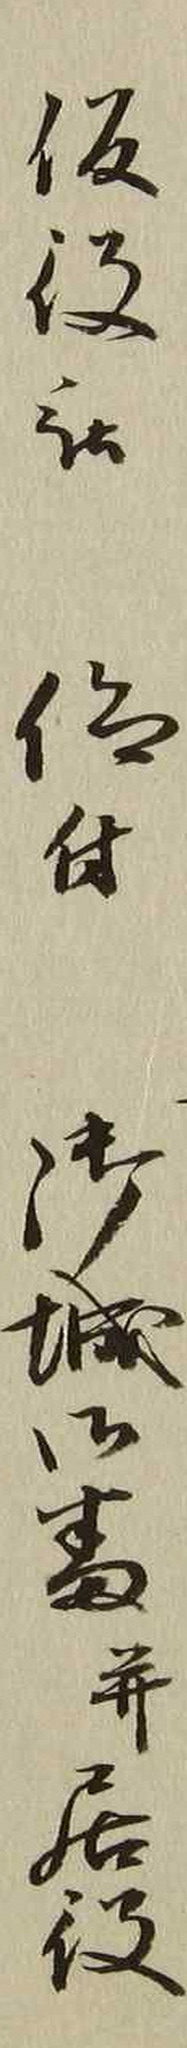仮役被仰付御城御番幷居役
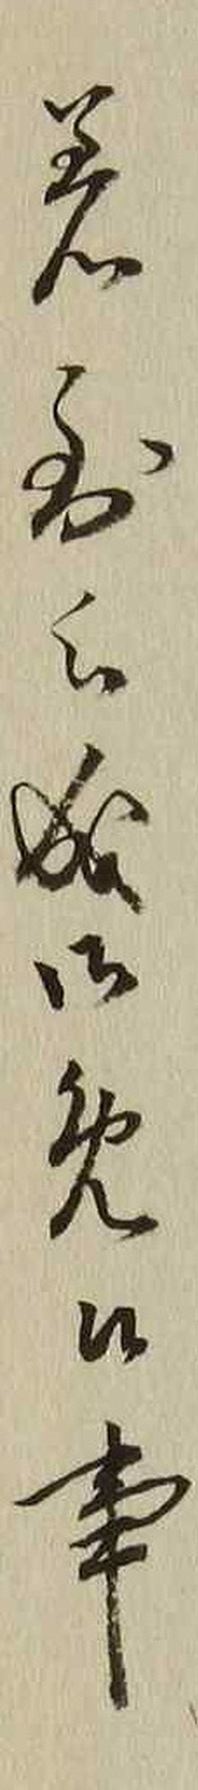着到被成御免候事
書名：諸士系譜　巻之61　と之部4
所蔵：会津若松市立会津図書館
